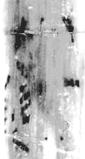○（夏）
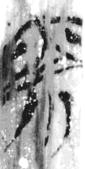○（夕）
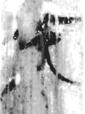內（入）
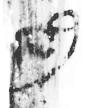月
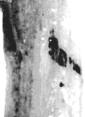八
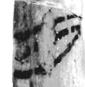日
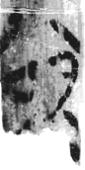八月
